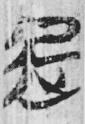○（起）
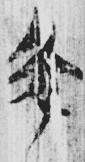帀（師）
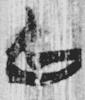㠯（以）
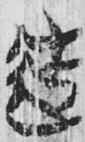逆
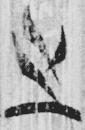之
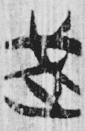武
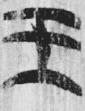王
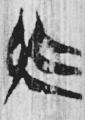於
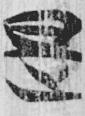是
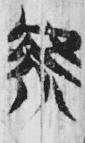{虍介}（乎）
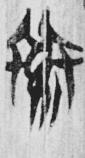素
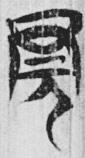○（冠）
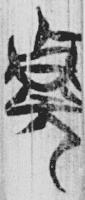○（冕）
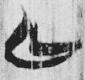㠯（以）
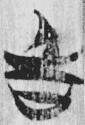告
